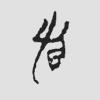左
